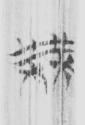無
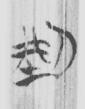型
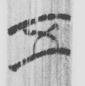五
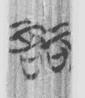訶
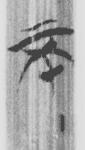不
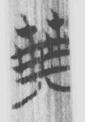典
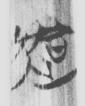迵
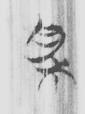{肉木}
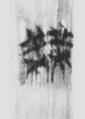無
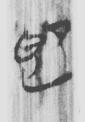即
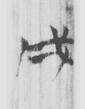戌
